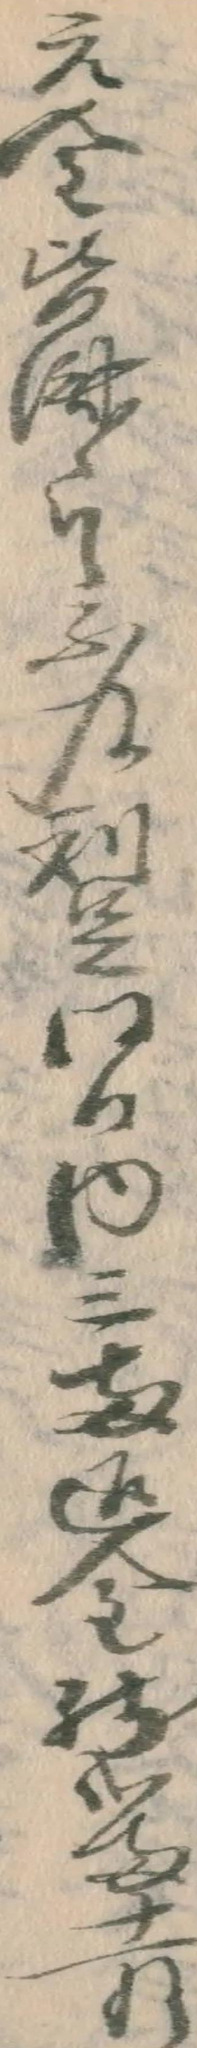元金皆済候ハヽ不及利足同日内三両退金残弐両十一月
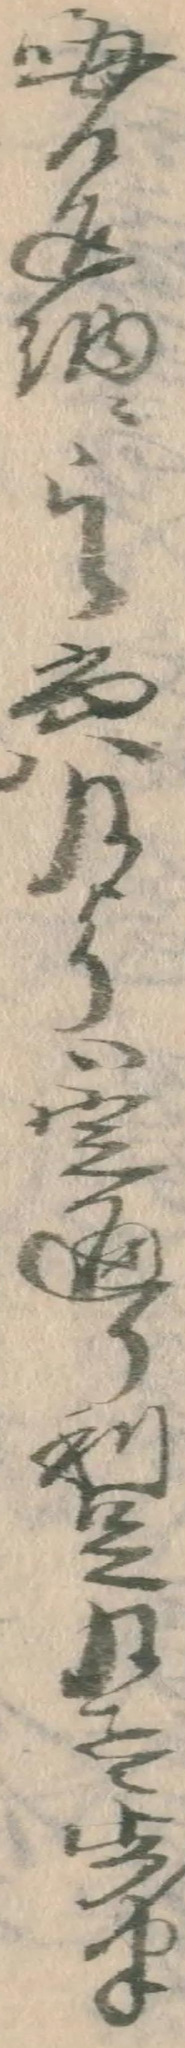晦日返納ニ候ハヽ當八月より御定通り利足月壱歩半
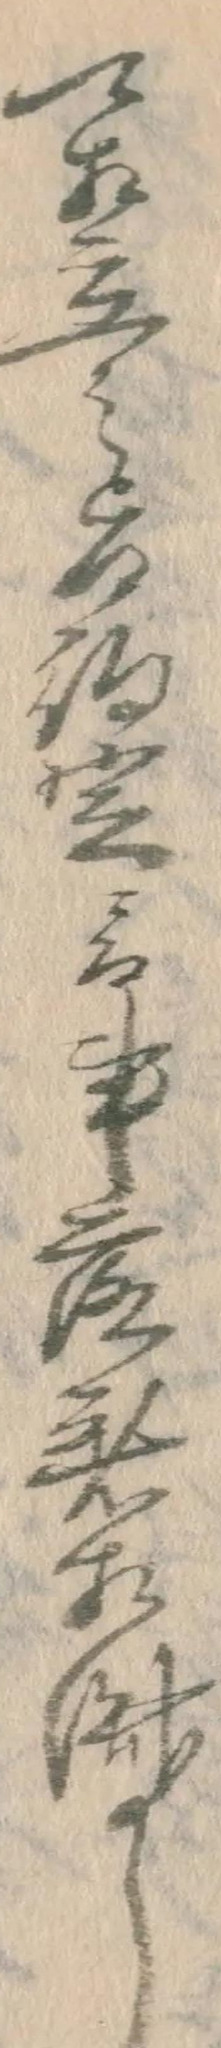可相立之旨約定ニ而事落着相済了
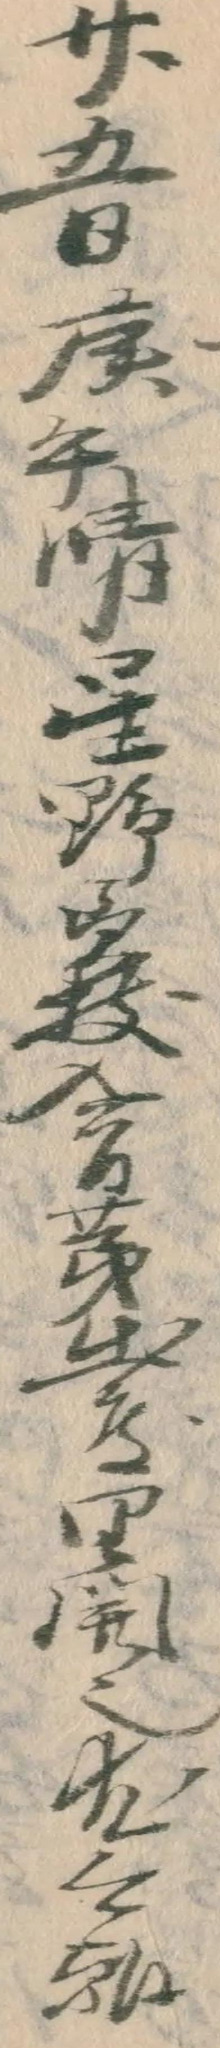廿五日庚午晴星野美枝今日芽出度里開也尤今朝
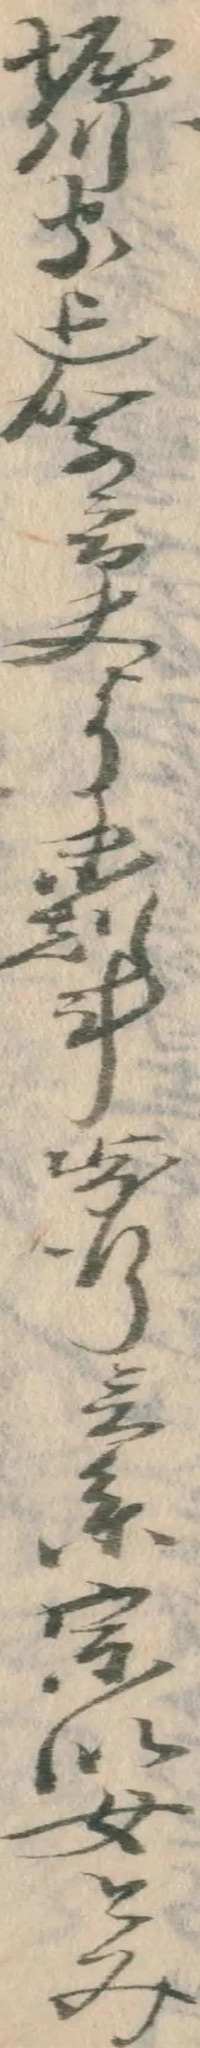堀川家迄駕ニ而夫より未刻斗歩行ニ而参宗以女とみ
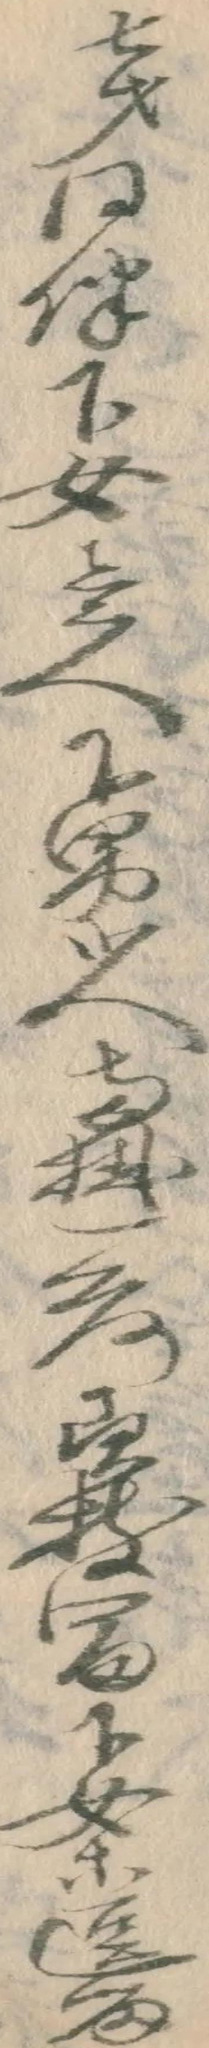七才同伴下女壱人下男弐人両掛一荷美枝富下女等逗留
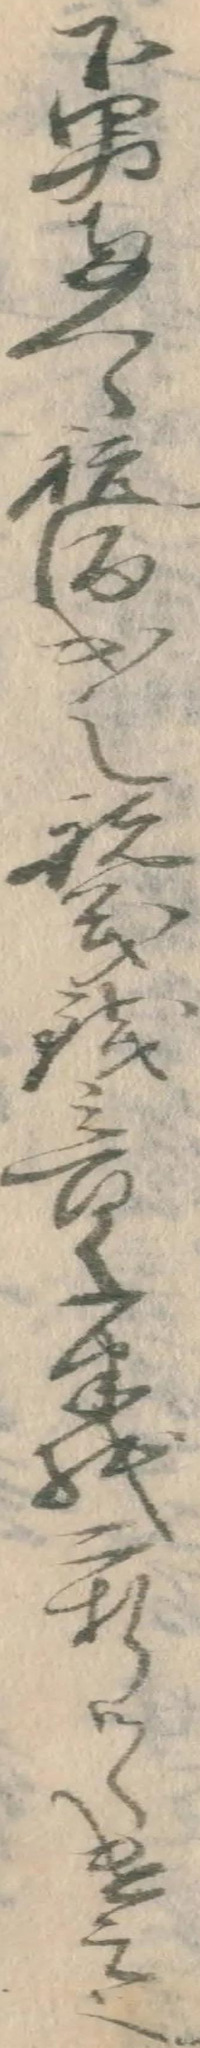下男両人へ祝酒式之祝義銭三百文半紙二折ツヽ遣之也
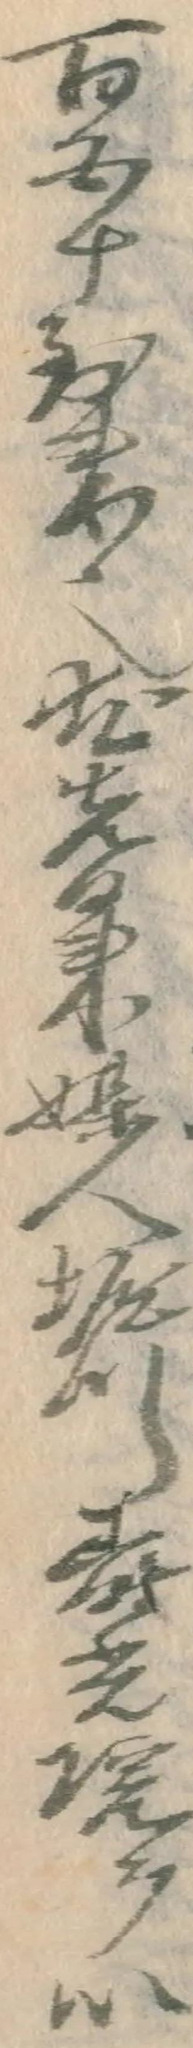百五十到来也尤先日来媒人堀川壽光院ヲ以

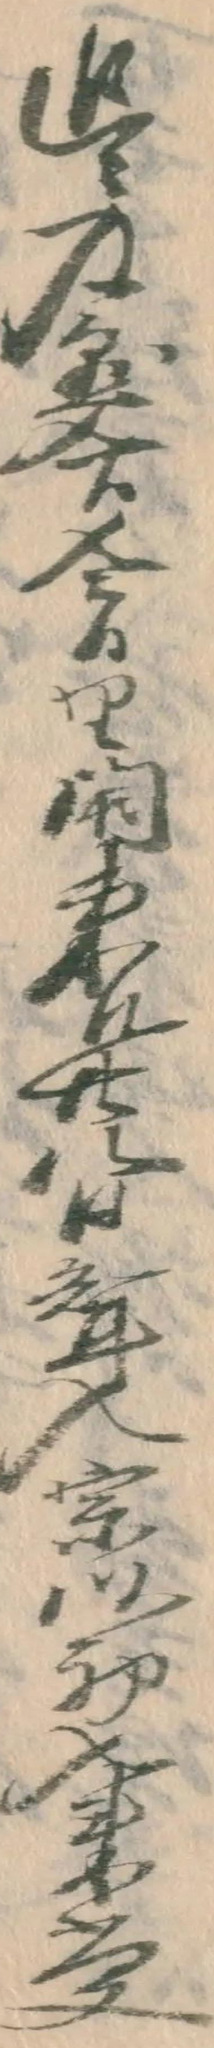追々及懸合今日里開来ル廿八日聟入宗以初入来尚又
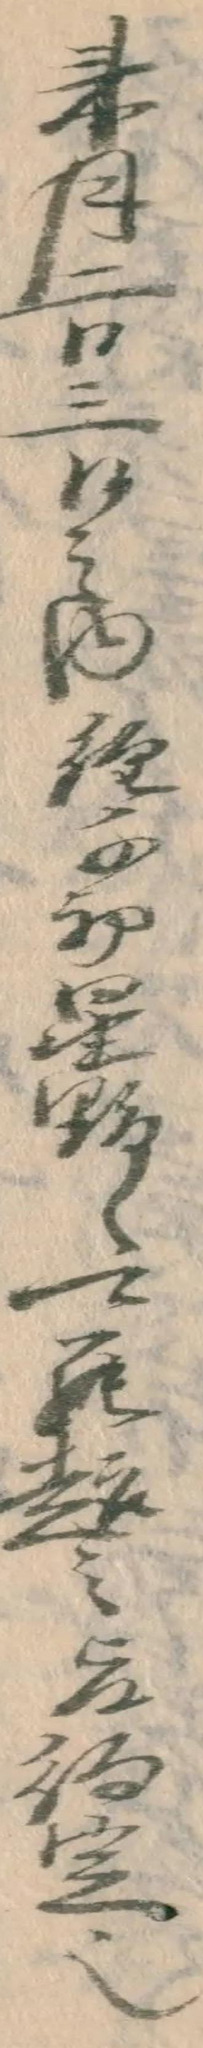来月二日三日之内経子初星野へ可罷越之旨約定也
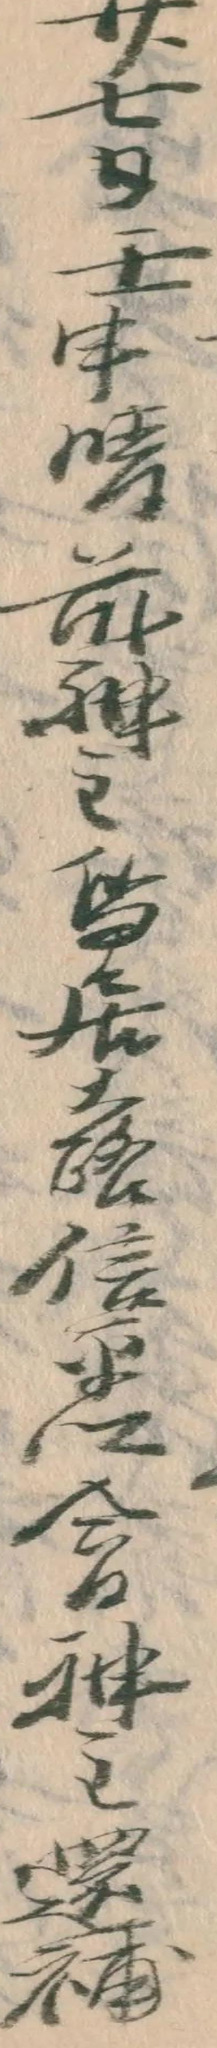廿七日壬申晴前神主鳥居大路信平卿今日神主還補
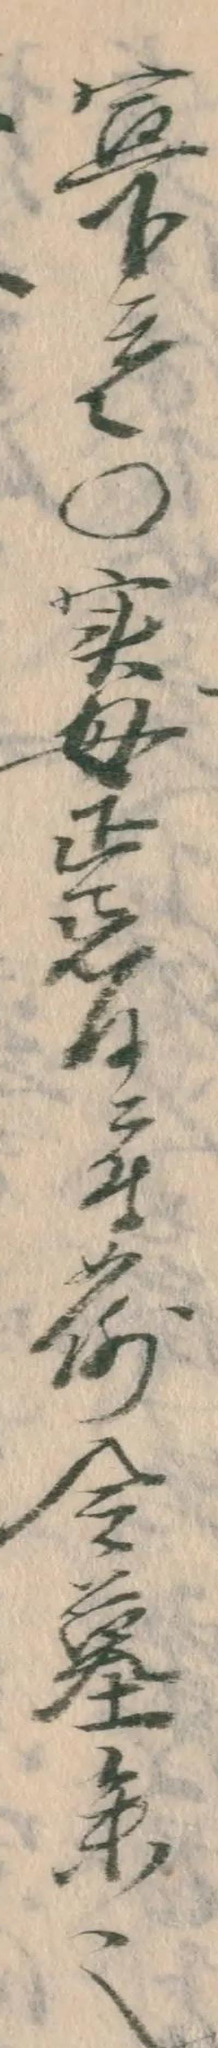宣下云々○実母正忌日ニ付如例令墓参也
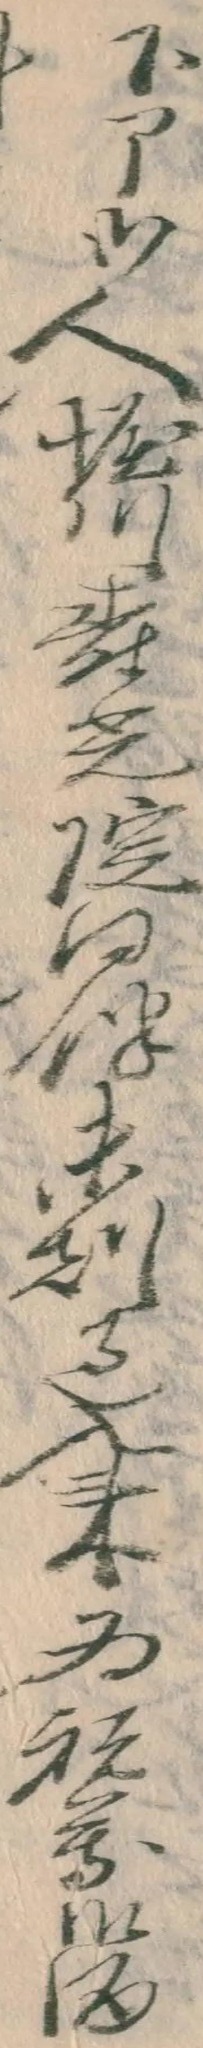下部弐人堀川壽光院同伴未刻過入来為祝義御酒
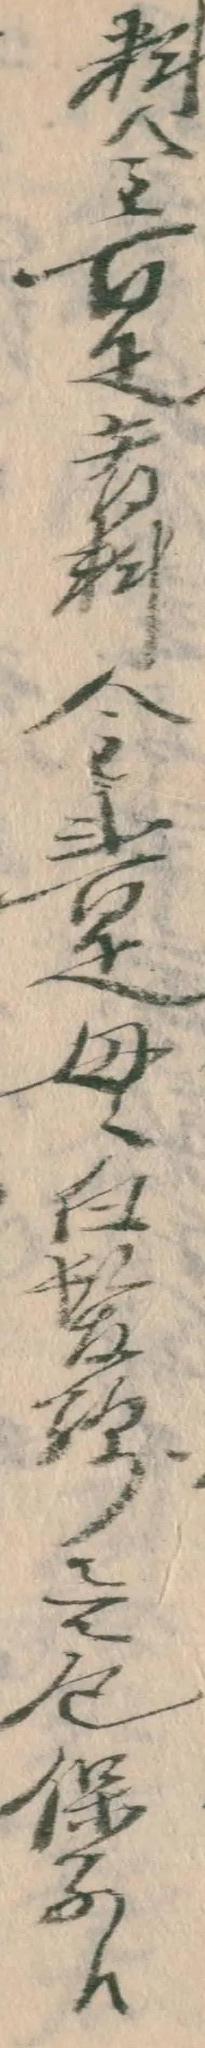料金百疋肴料金弐百疋母へ白髪綿壱包保子え
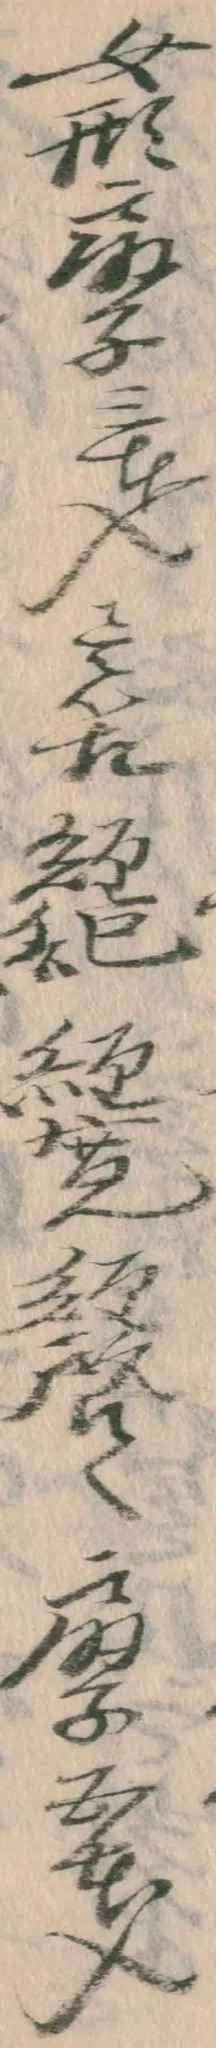女形扇子三本入壱箱経紀経寛経啓へ扇子五本入
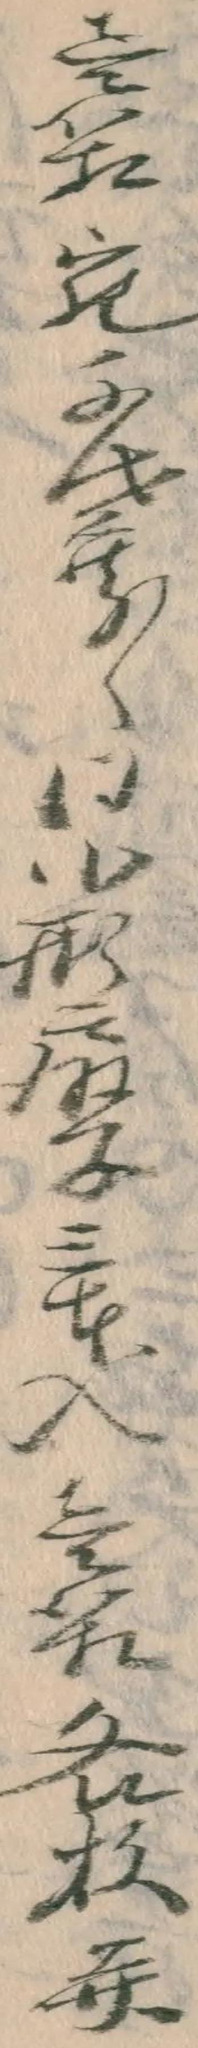壱箱宛千代蔵ヘ同小形扇子三本入壱箱各数幷
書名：賀茂社記録. 第67冊
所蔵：国立国会図書館 National Diet Library, JAPAN
